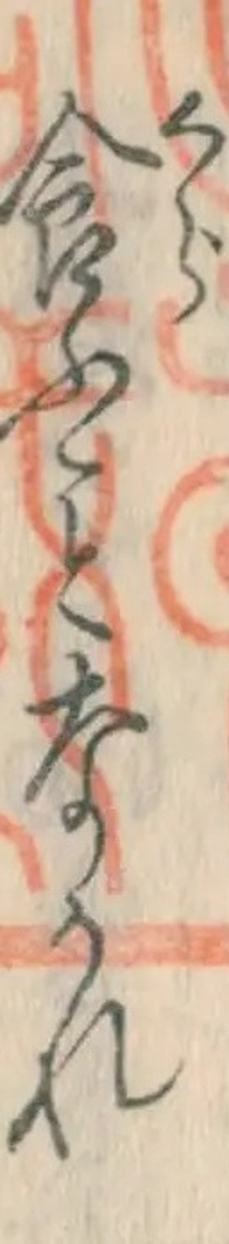食ふことなかれ
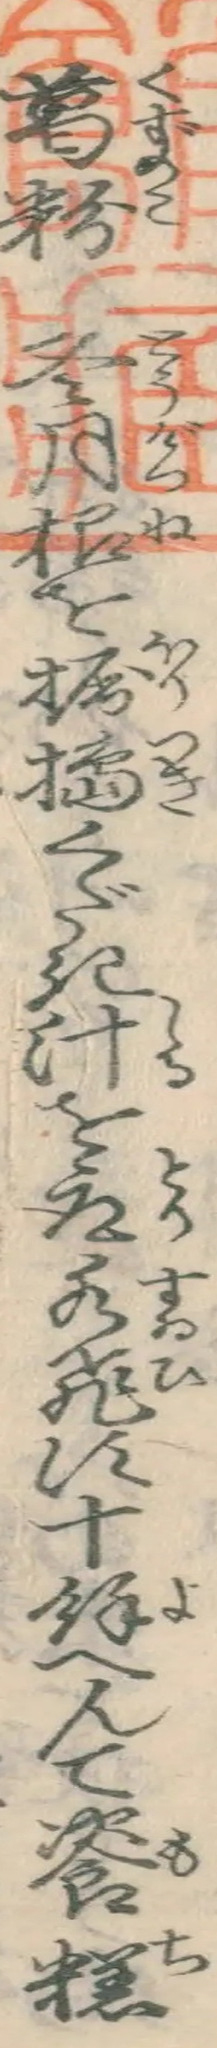葛粉冬月根を掘搗くだき汁を取水飛す十余へんて餈糕
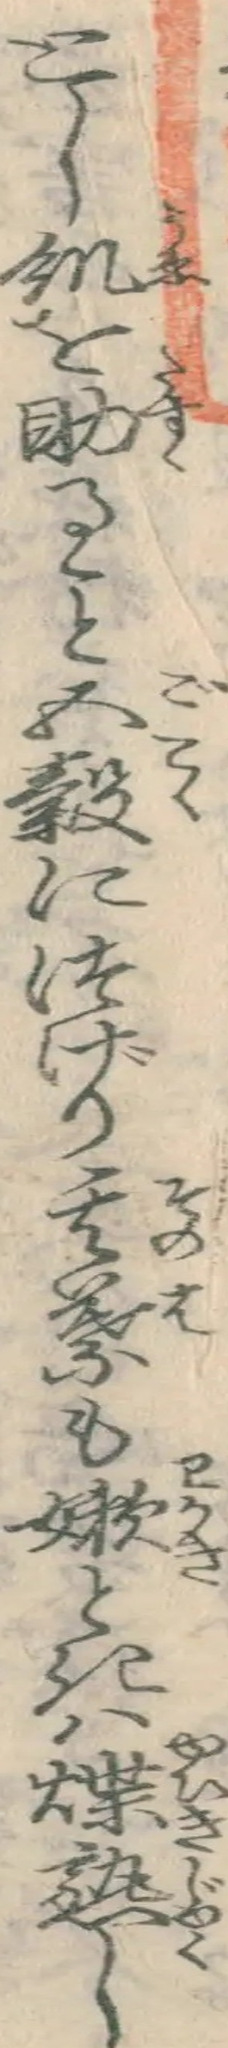とし飢を助ること五穀につげり其葉も嫰ときは煠熟し
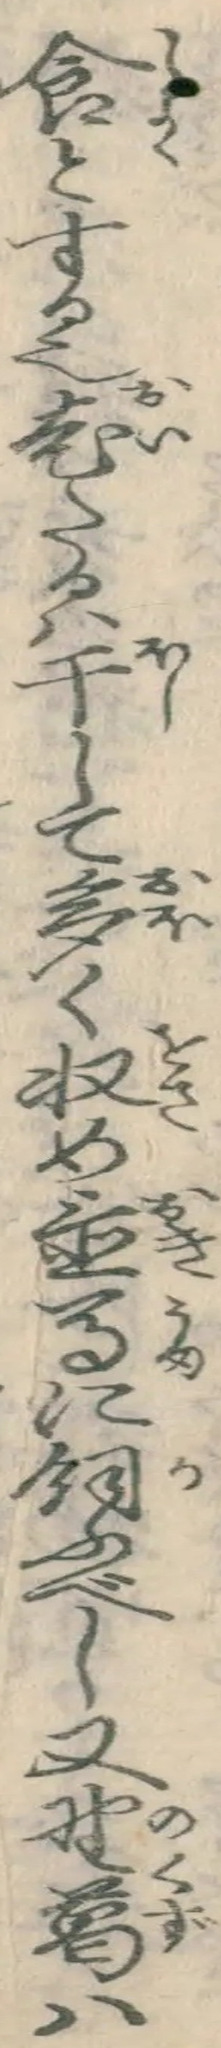食とする也老たるは干して多く収め置馬に飼ふべし又野葛は
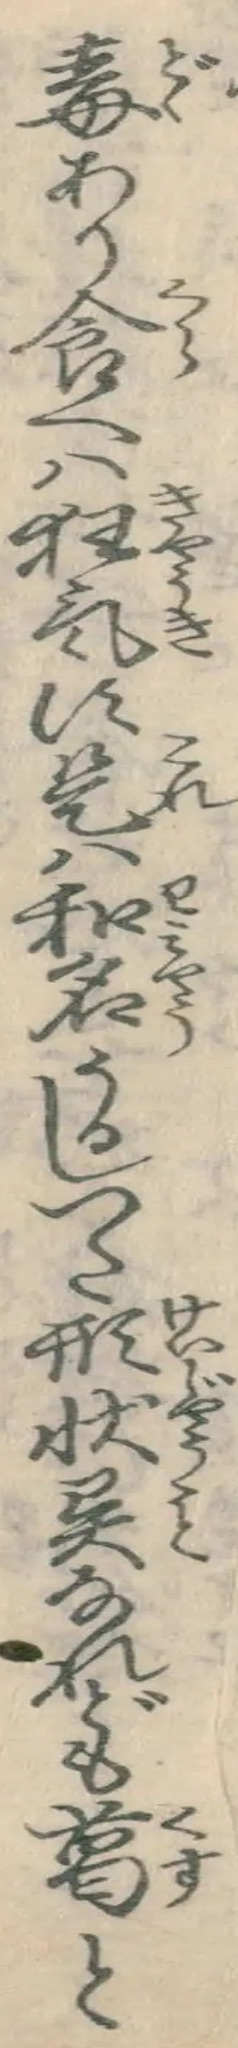毒あり食へは狂気す是は和名うるしつた形状異なれども葛と

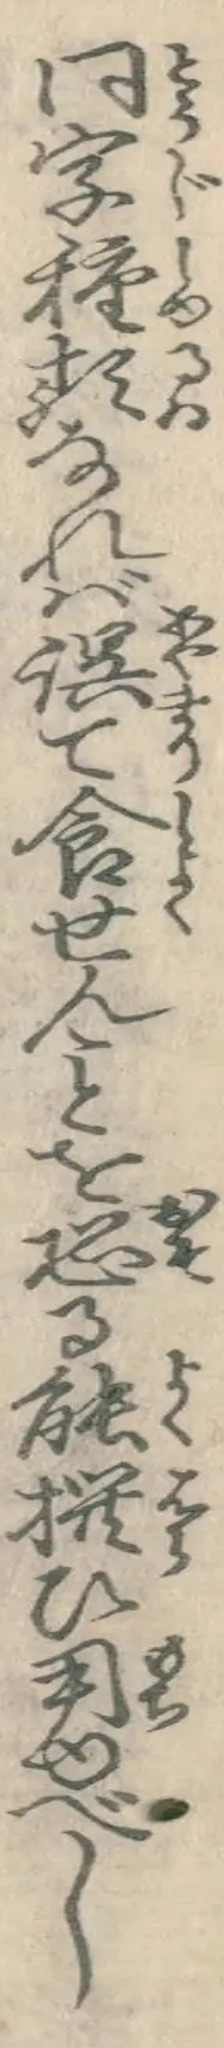同字種類なれば誤て食せんことを恐る能撰ひ用ゆべし
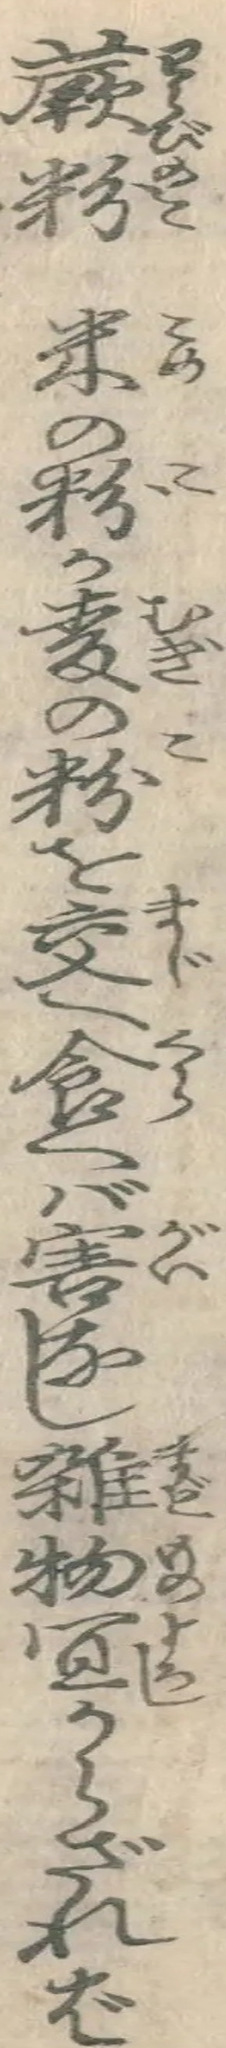蕨粉米の粉か麦の粉を交へ食へば害なし雑物宜からざれば
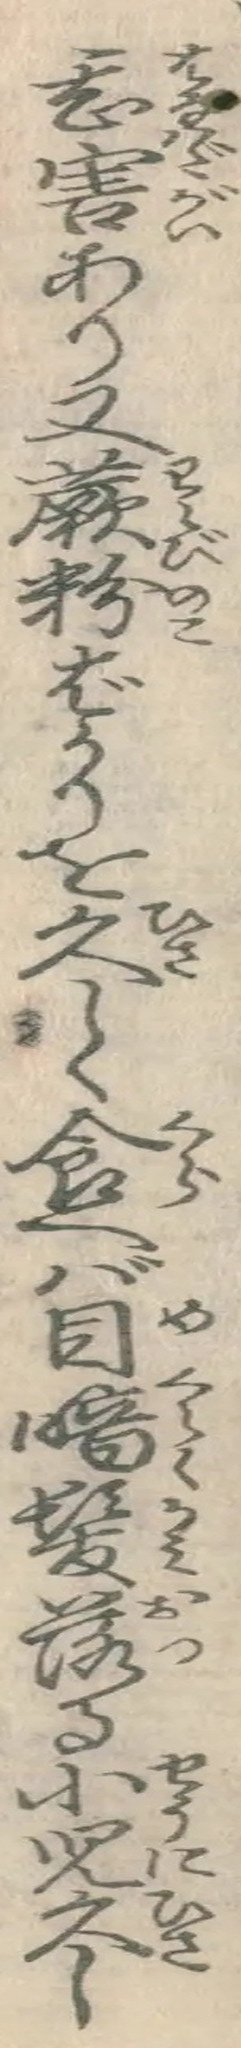甚害あり又蕨粉ばかりを久しく食へば目暗髪落る小児久し
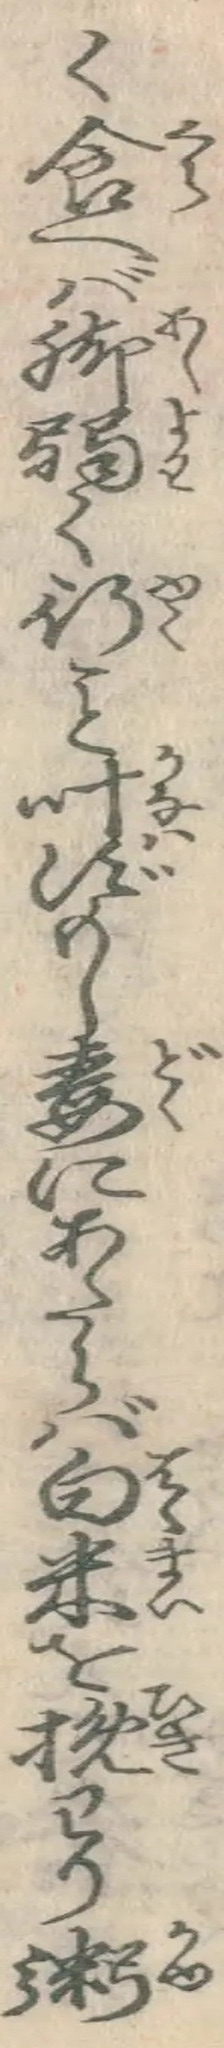く食へば脚弱く行こと叶ずもし毒にあたらば白米を挽わり粥
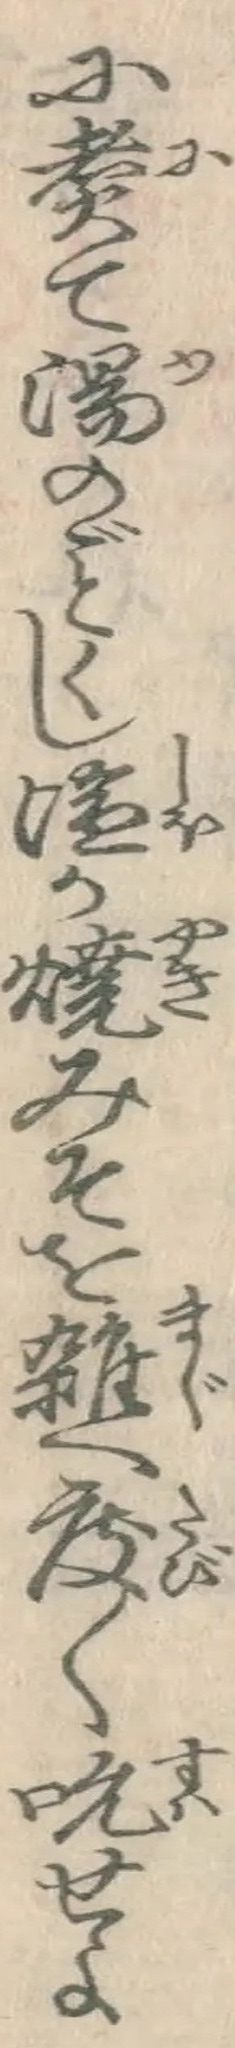に煮て湯のごとくし塩か焼みそを雑へ度々吮せよ
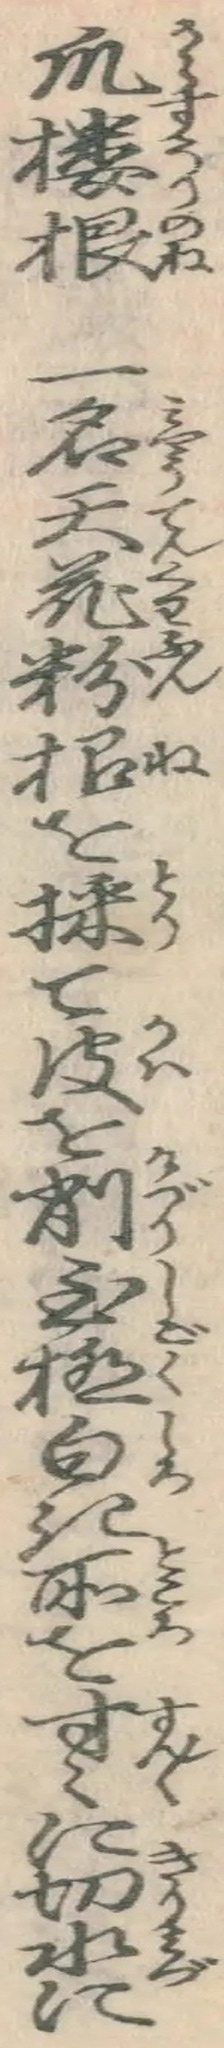瓜楼根一名天花粉根を採て皮を削至極白き所を寸々に切水に
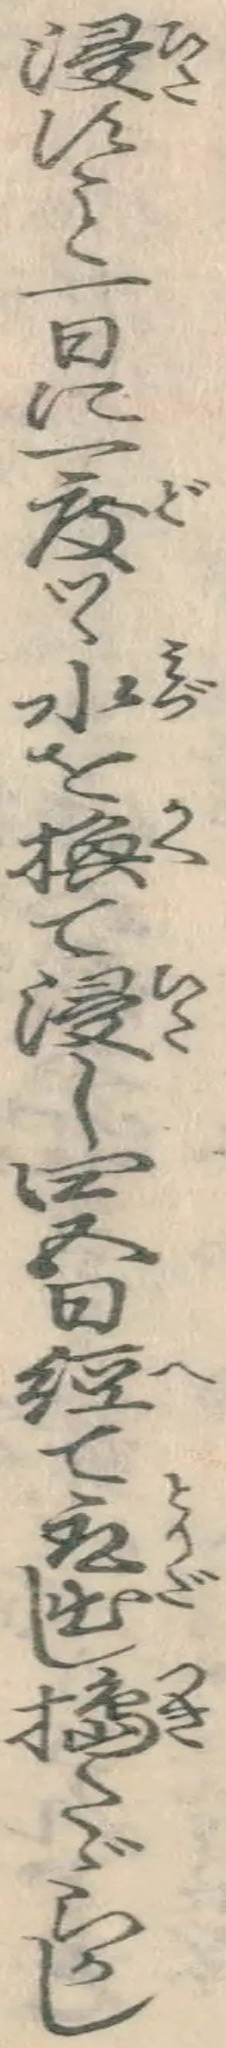浸すこと一日に一度ツヽ水を換て浸し四五日経て取出し搗たゞらかし
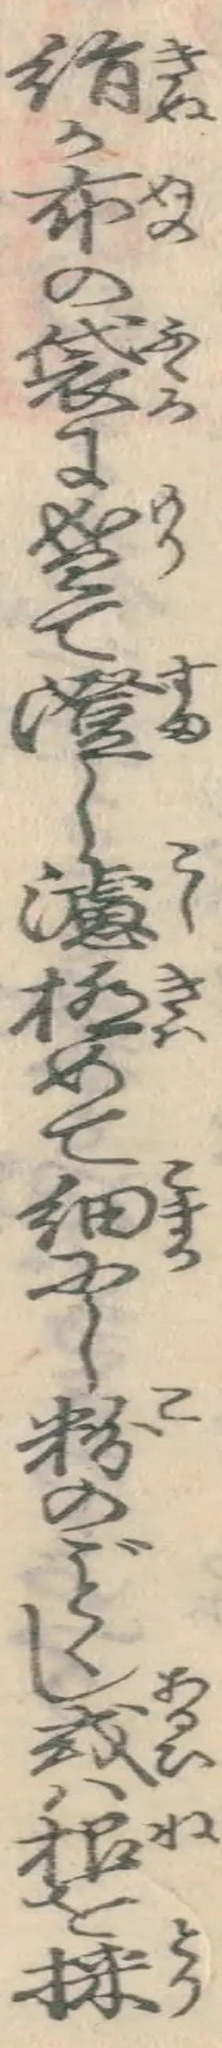絹か布の袋に盛て澄し濾極めて細にし粉のごとくし或は根を採
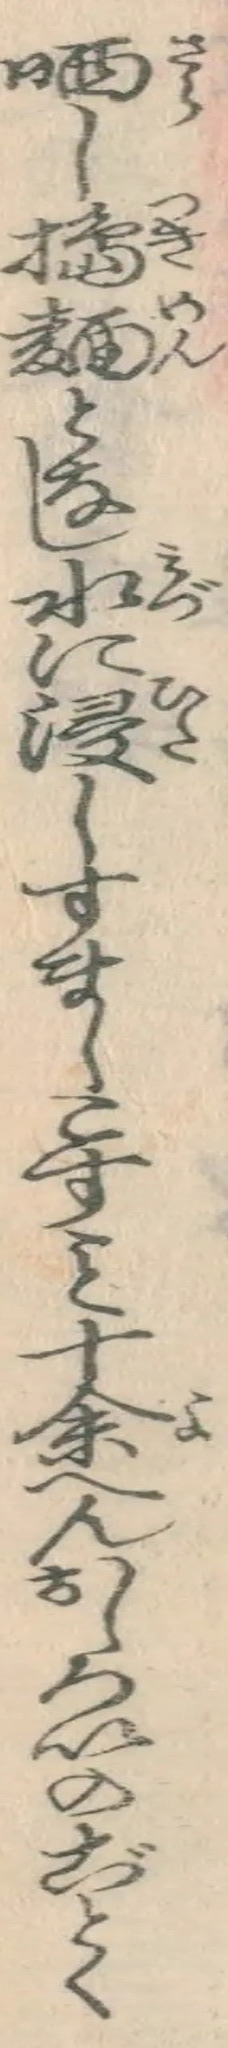晒し搗麺となし水に浸しすましこすこと十余へんおしろいのごとく
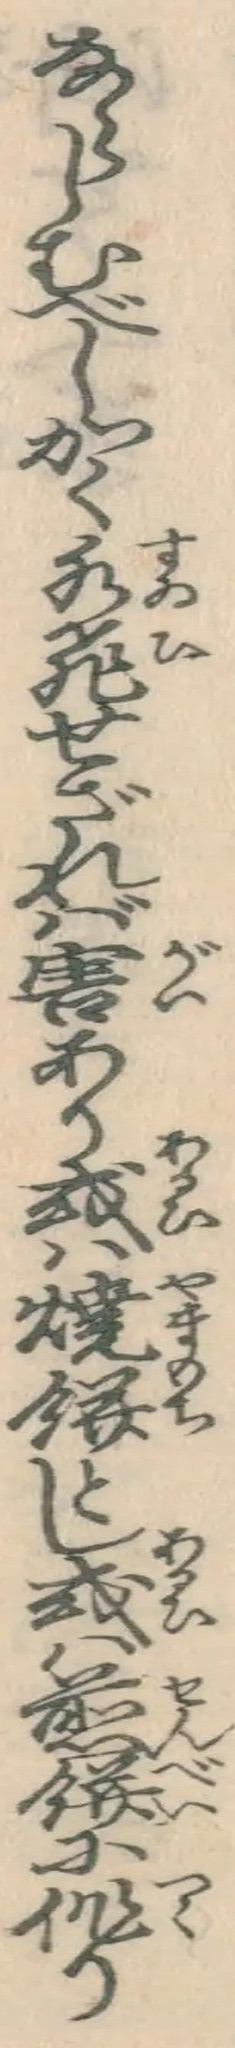ならしむべしかく水飛せざれば害あり或は焼餅とし或は煎餅に作り
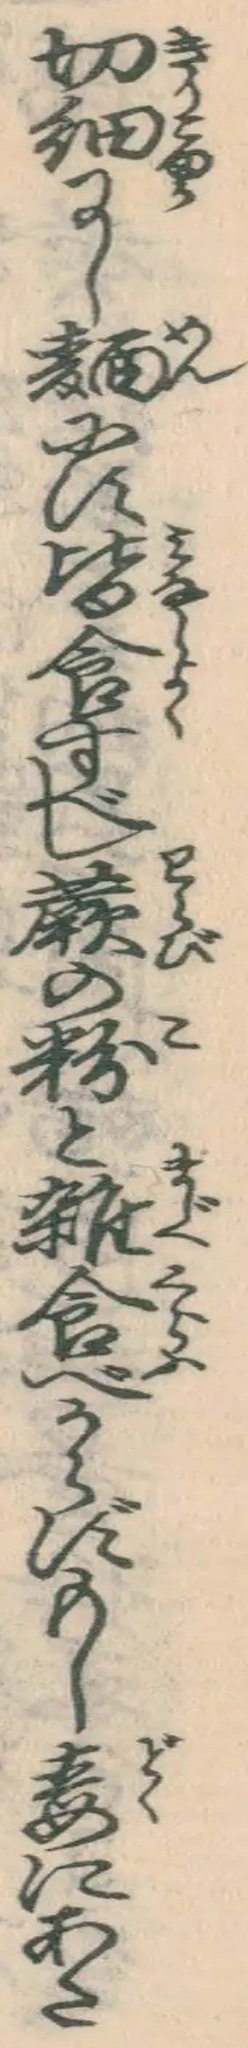切細にし麺にす皆食すべし蕨の粉と雑食べからずもし毒にあた
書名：経済をしへ草
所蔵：国立国会図書館 National Diet Library, JAPAN
